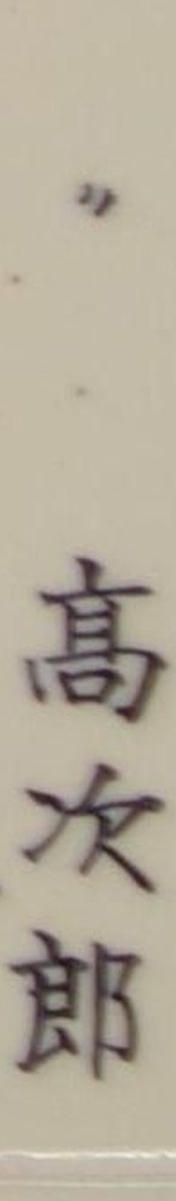高次郎
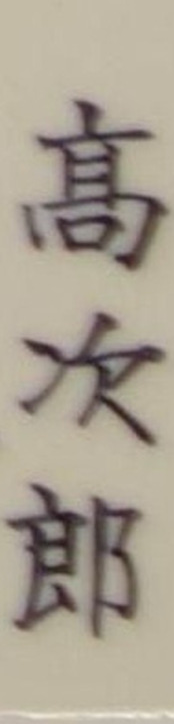高次郎
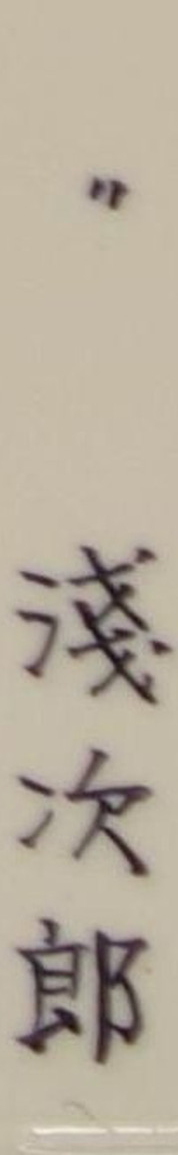浅次郎
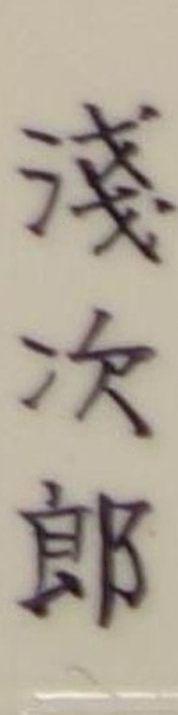浅次郎
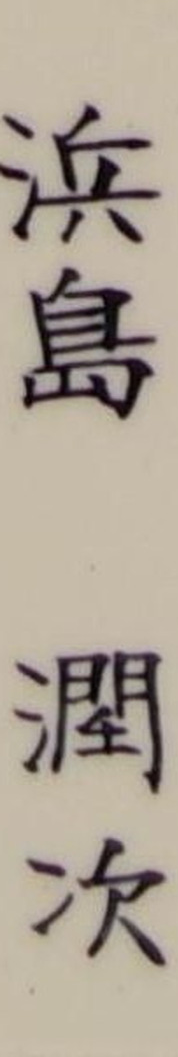浜島潤次
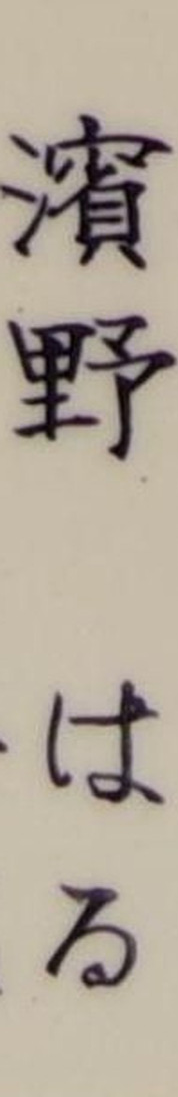濱野はる
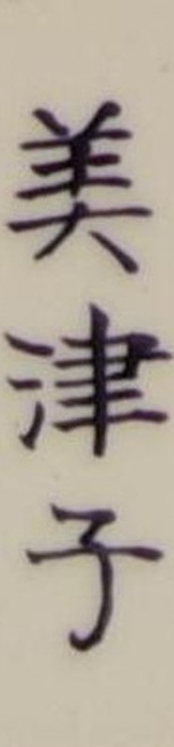美津子
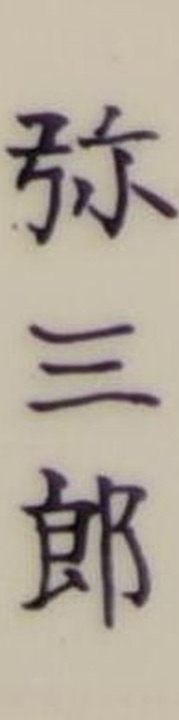弥三郎
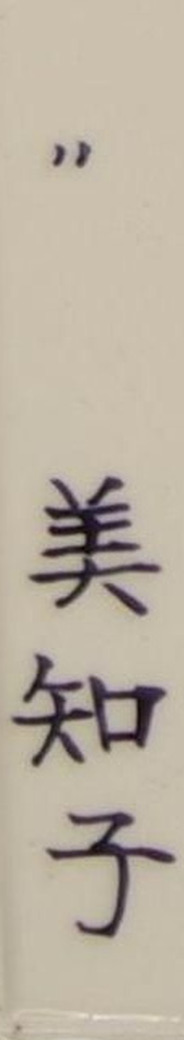美知子
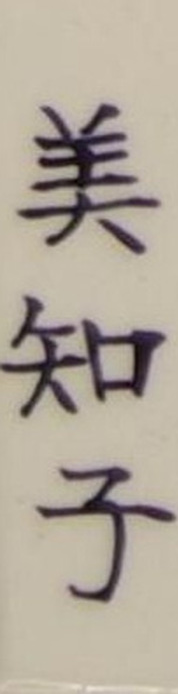美知子

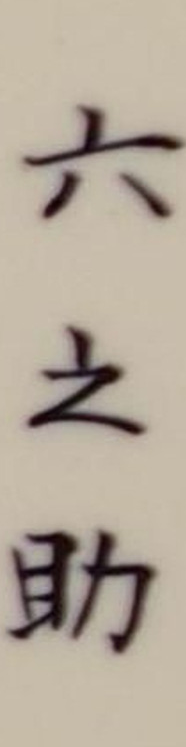六之助
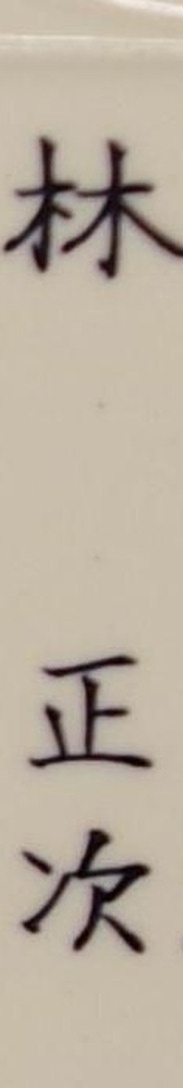林正次
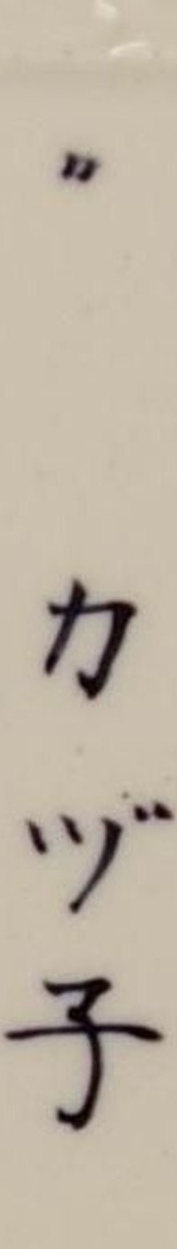カヅ子
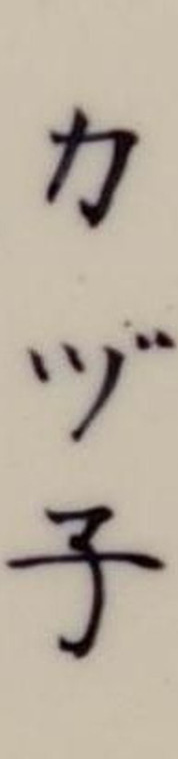カヅ子
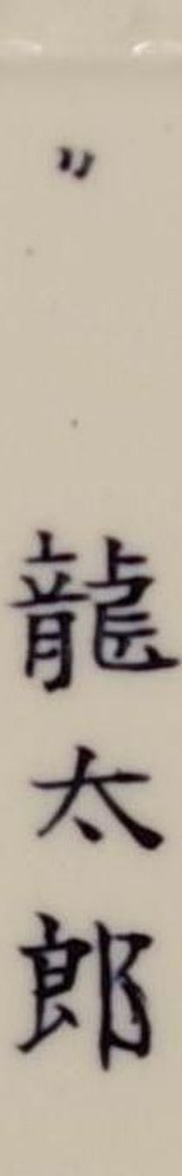龍太郎
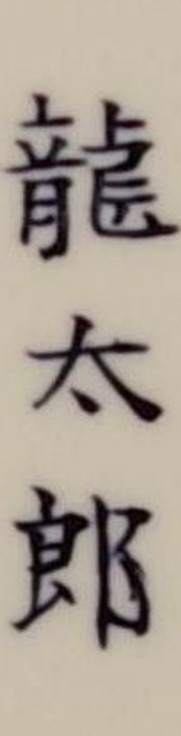龍太郎
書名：M~S
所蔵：高野山金剛峯寺
